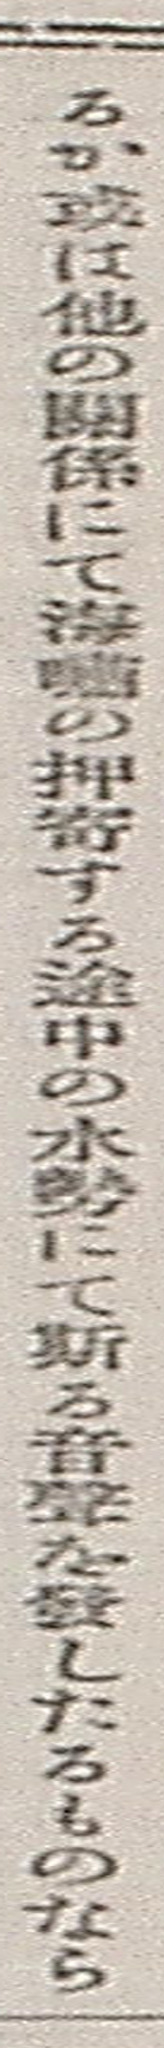るか或は他の関係にて海嘯の押寄する途中の水勢にて斯る音声を発したるものなら
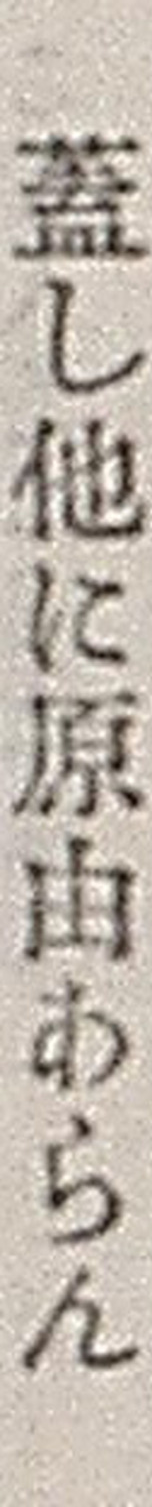蓋し他に原由あらん

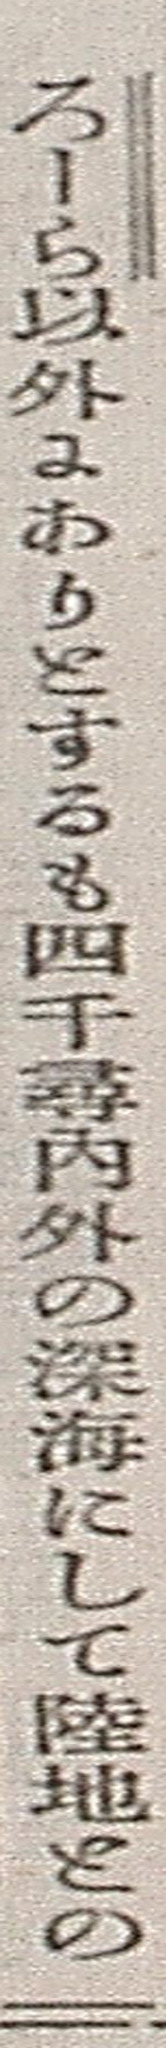ろーら以外にありとするも四千尋内外の深海にして陸地との
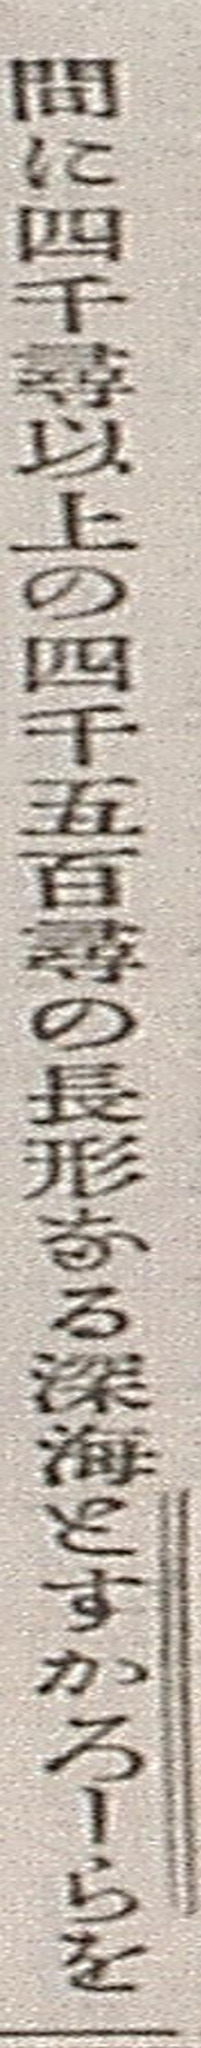間に四千尋以上の四千五百尋の長形なる深海とすかろーらを
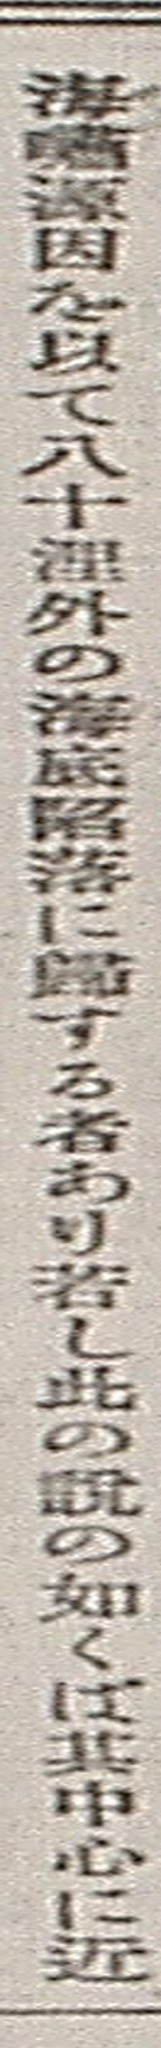海嘯源因を以て八十浬外の海底陥落に帰する者あり若し此の説の如くば其中心に近
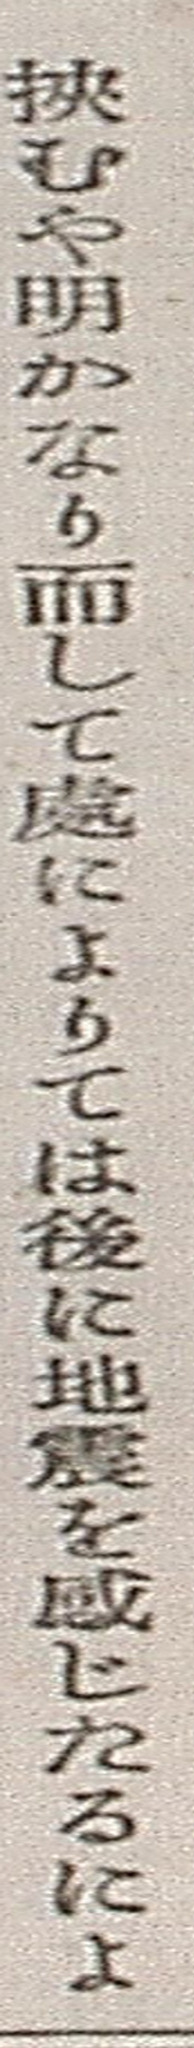挟むや明かなり而して処によりては後に地震を感じたるによ
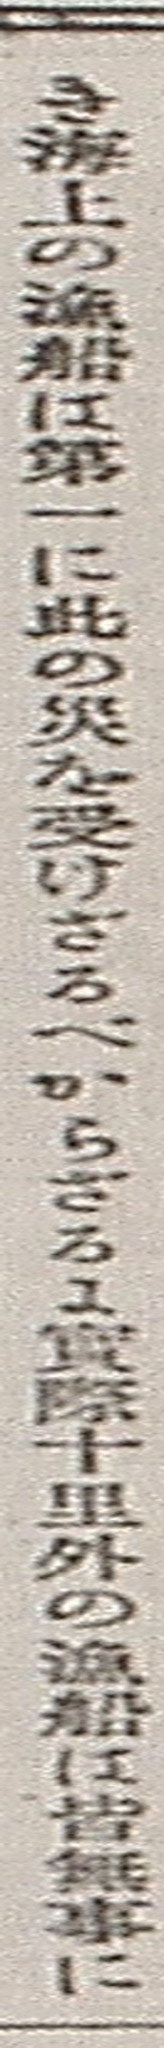き海上の漁船は第一に此の災を受けざるべからざるに実際十里外の漁船は皆無事に
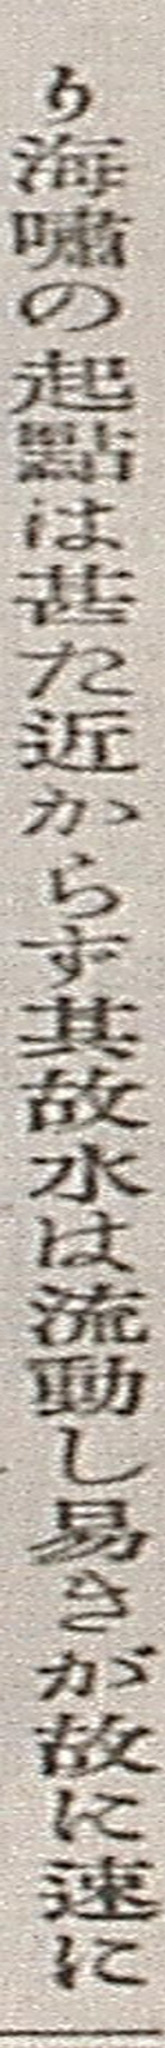り海嘯の起点は甚た近からず其故水は流動し易きが故に速に
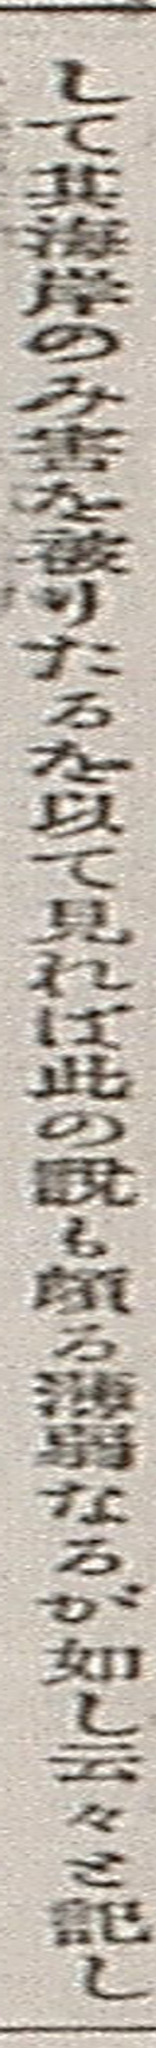して其海岸のみ害を被りたるを以て見れば此の説も頗る薄弱なるが如し云々と記し
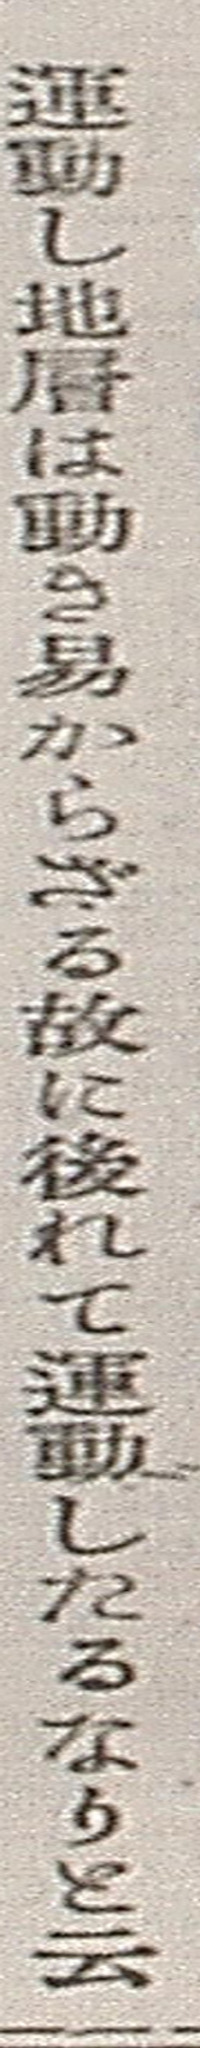運動し地層は動き易からざる故に後れて運動したるなりと云
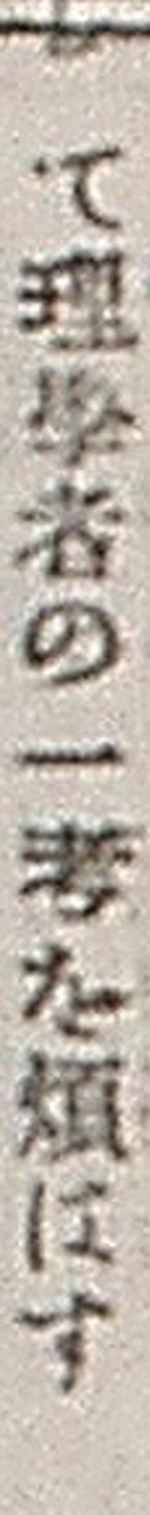て理学者の一考を煩はす
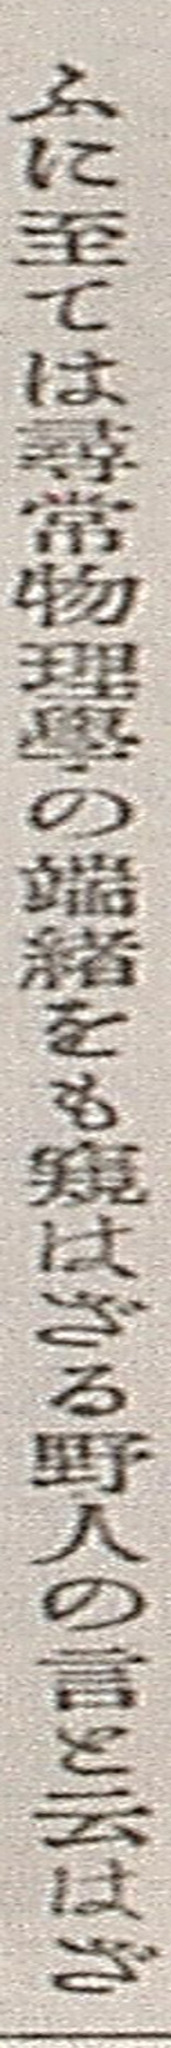ふに至ては尋常物理学の端緒をも窺はざる野人の言と云はざ
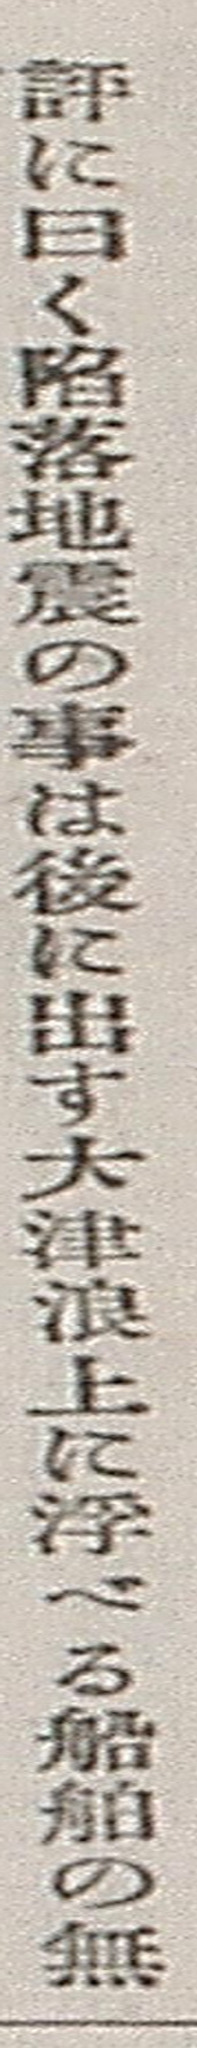評に曰く陥落地震の事は後に出ず大津浪上に浮べる船舶の無
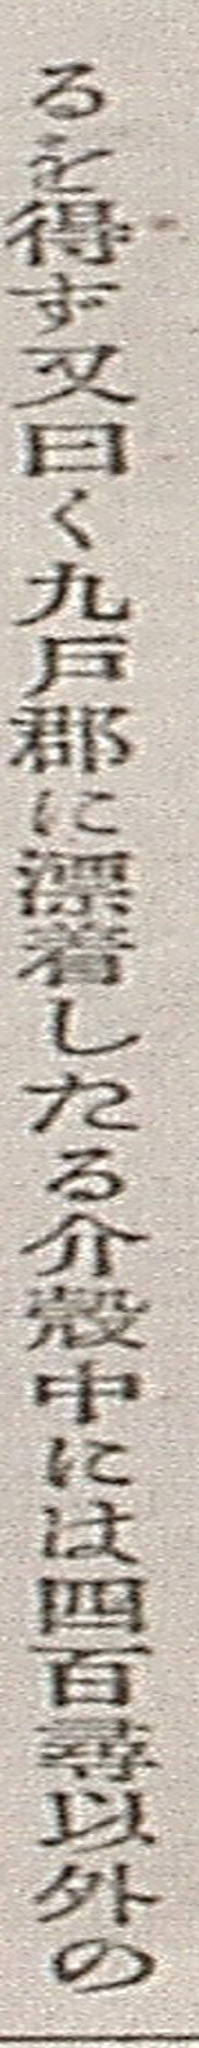るを得ず又曰く九戸郡に漂着したる介殻中には四百尋以外の
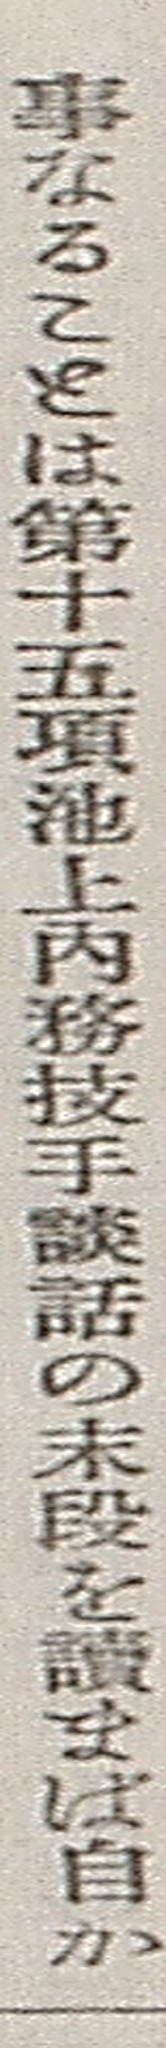事なることは第十五項池上内務技手談話の末段を読まば自か
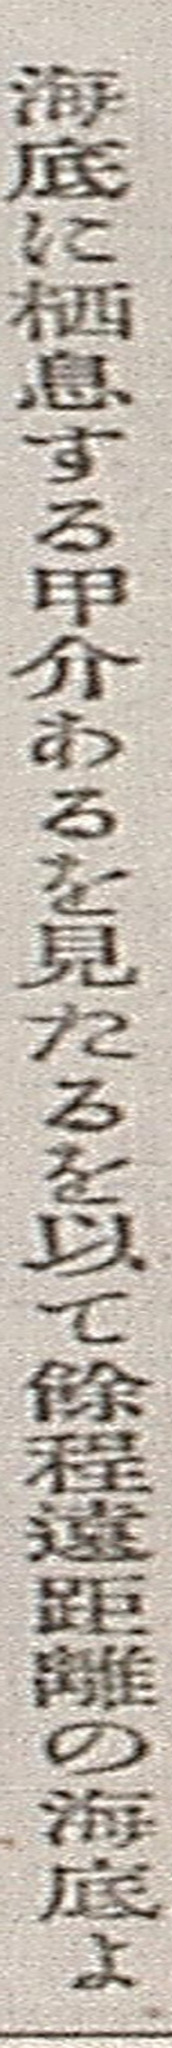海底に栖息する甲介あるを見たるを以て余程遠距離の海底よ
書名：風俗畫報臨時増刊第百十九號　大海嘯被害録（中）
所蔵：東京大学地震研究所図書室 Earthquake Research Institute Library, The University of Tokyo, JAPAN
